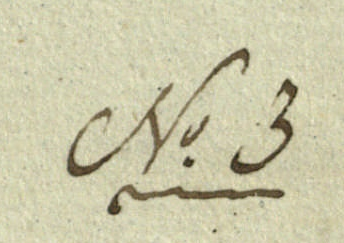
Nº 3
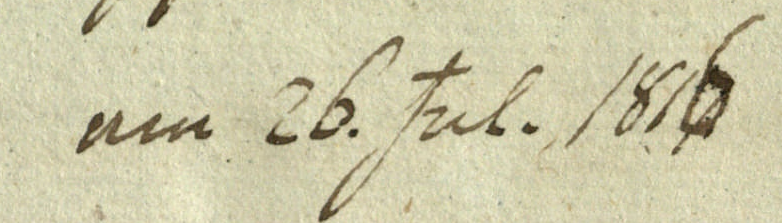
am 26. Jul. 1816.
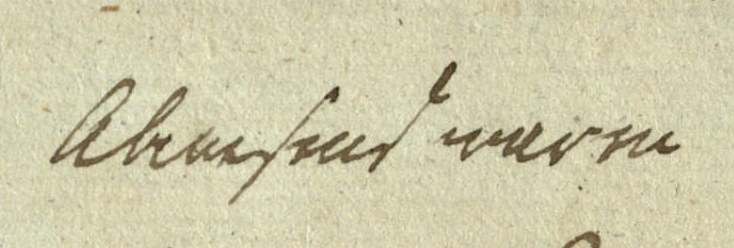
Abwesend waren
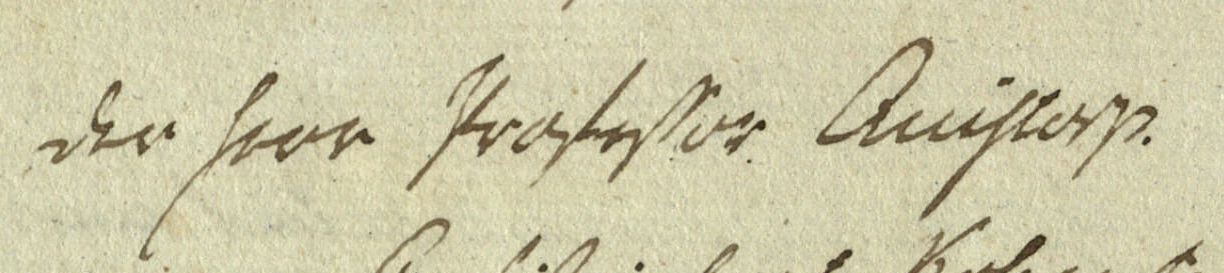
der Herr Professor Quistorp.
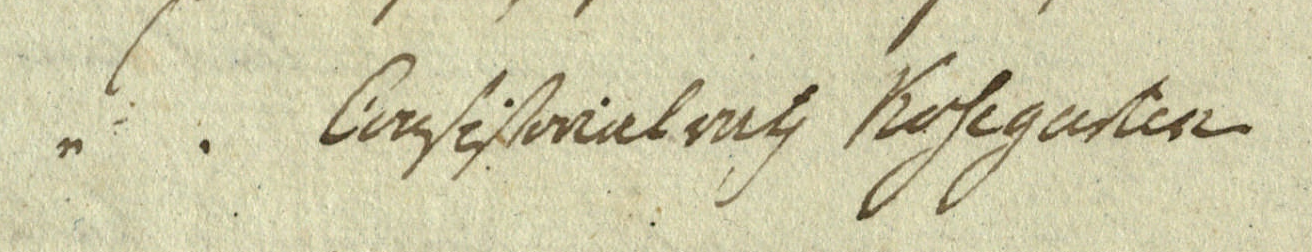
Consistorialrath Kosegarten.
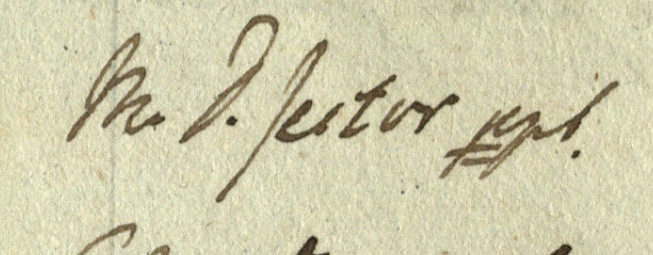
M. D Rector ppt.
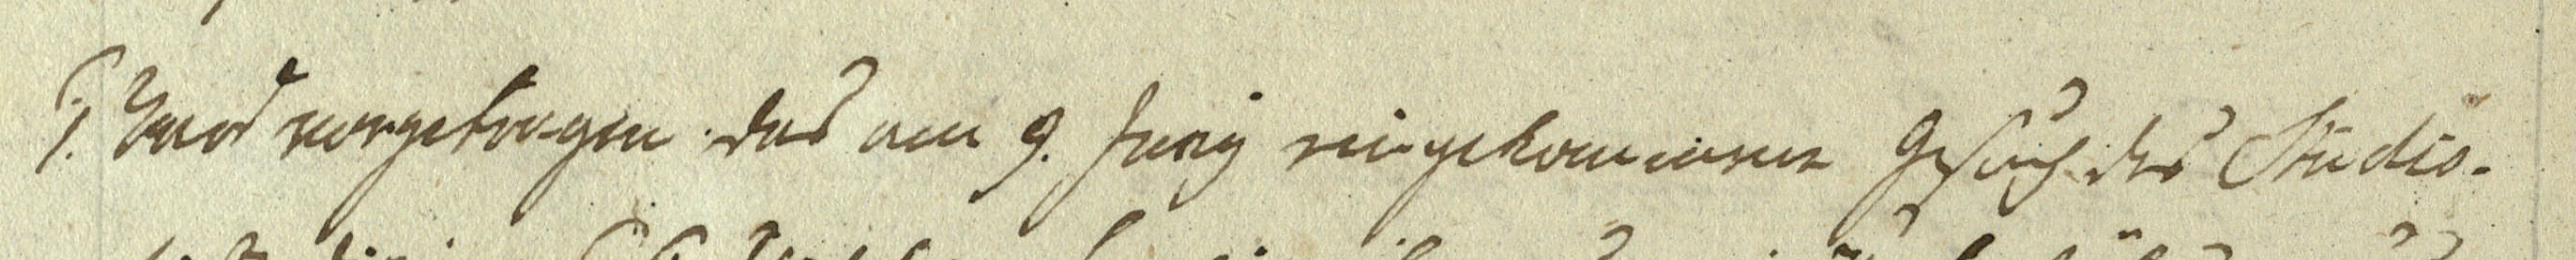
1. Ward vorgetragen das am 9. Junÿ eingekommene Gesuch der Studio¬
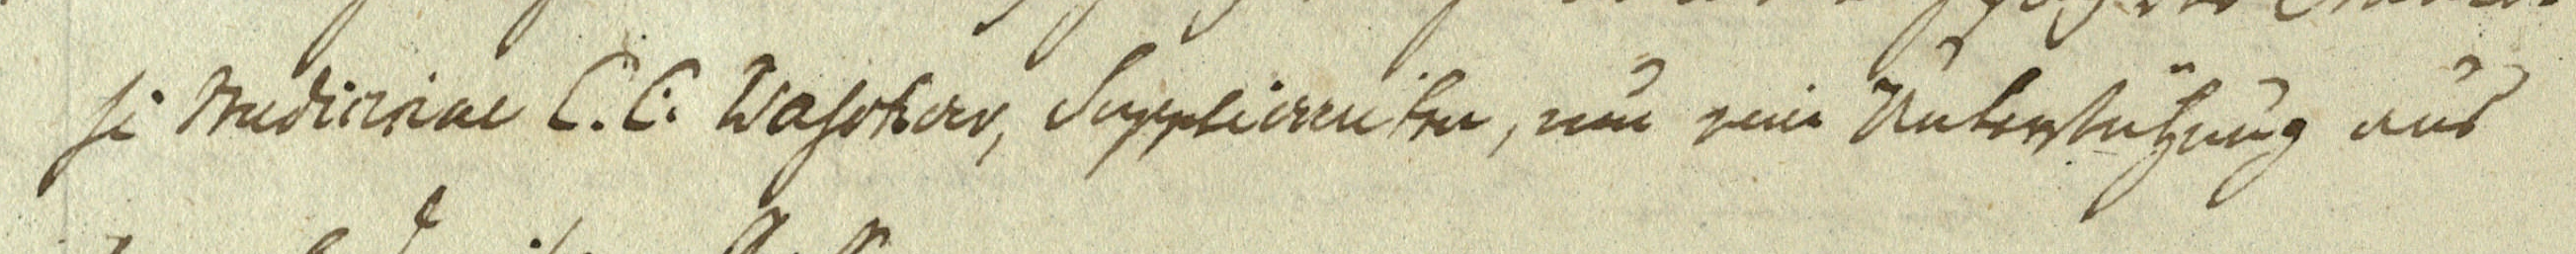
si Medicinae C. C. Waschow, Supplicanten, um eine Unterstützung aus
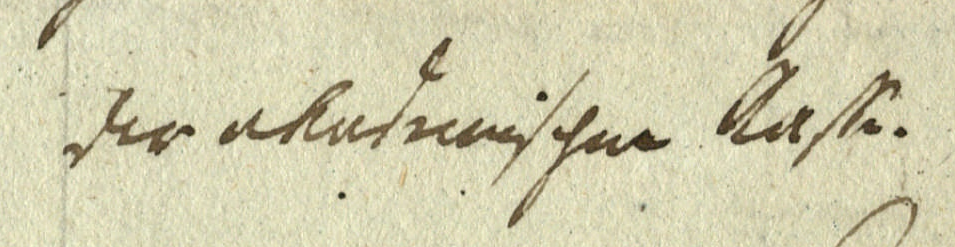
der akademischen Kasse.
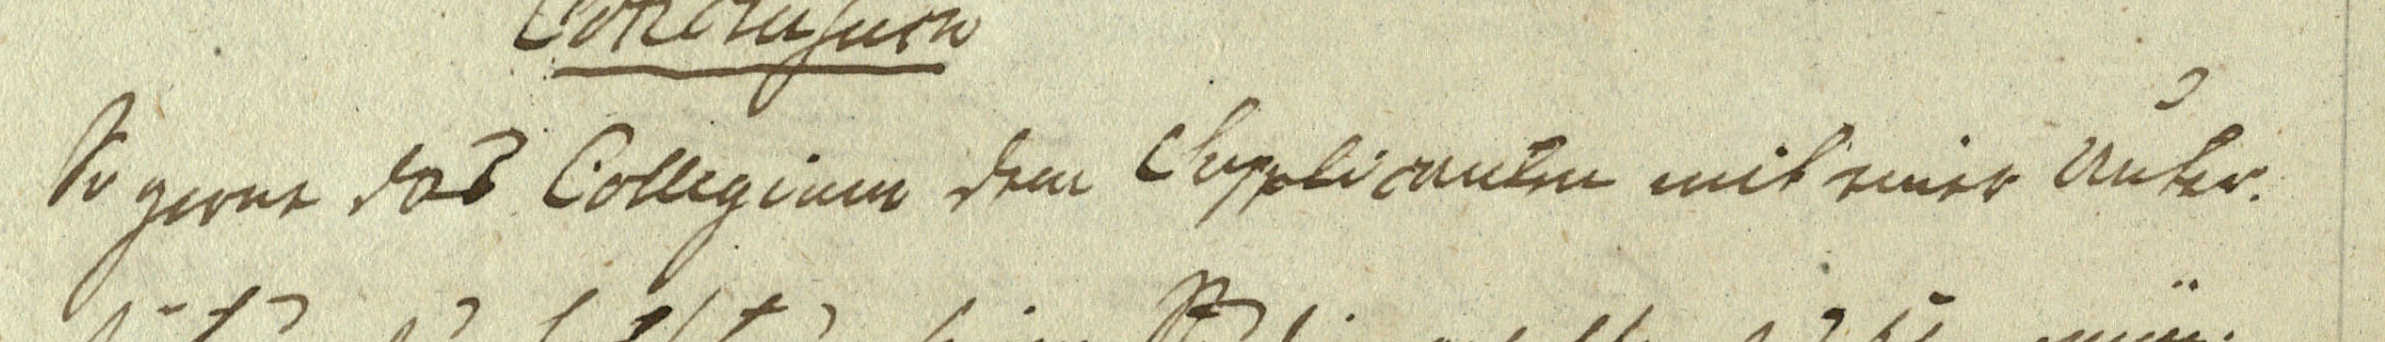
So gerne das Collegium dem Supplicanten mit einer Unter¬
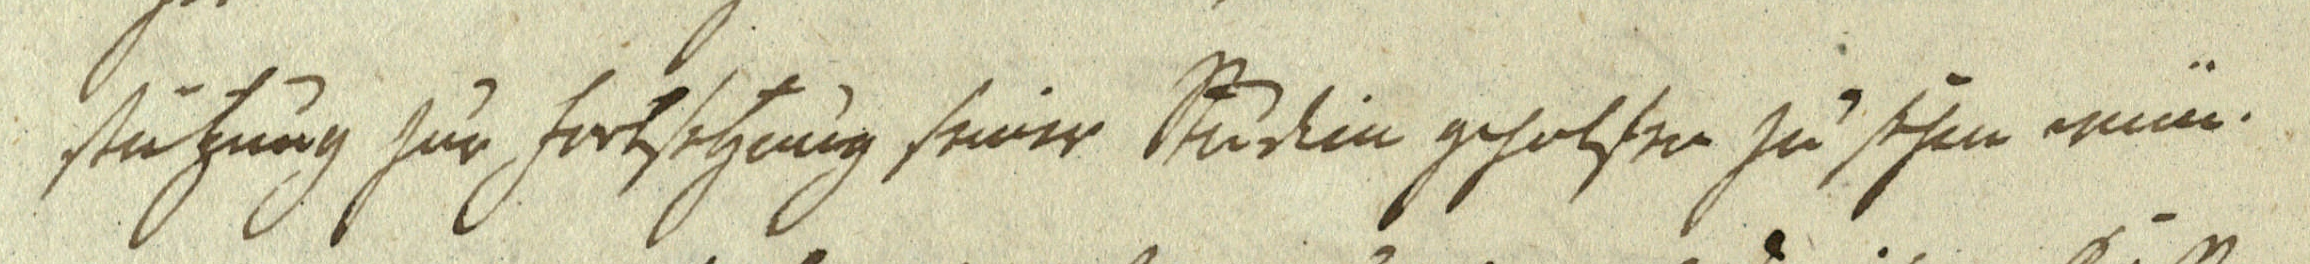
stützung zur Fortsetzung seiner Studien geholfen zu sehen wün¬
